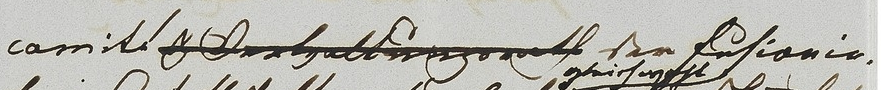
comité & Verwaltungsrath der fusionir-
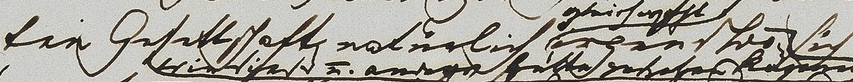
ten Gesellschaft natürlich gleichwohl irgendwo sich
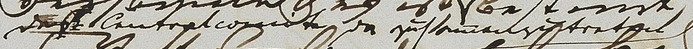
das Centralcomité da zusammenzutreten
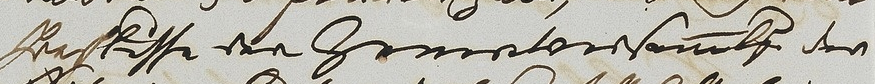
Beschlusse der Generalversammlg. der
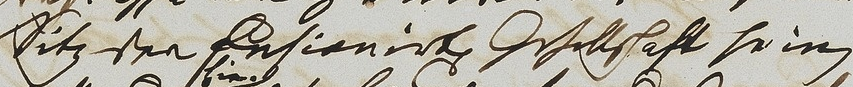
Sitz der fusionirten Gesellschaft sein
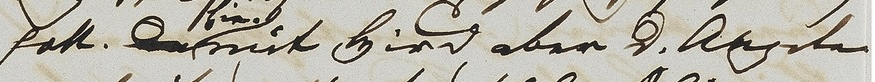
soll. DaHiemit wird aber d. Angele-
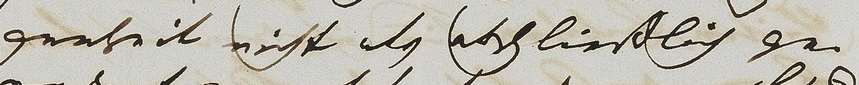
genheit nicht als abschließlich ge-
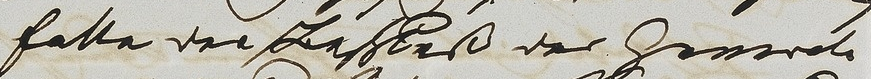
Falle der Beschluß der General-
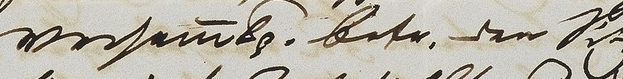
versammlg. betr. den Sitz
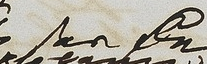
der fu-
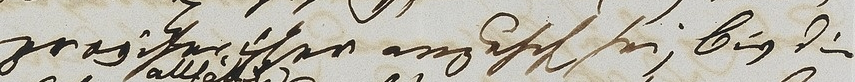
provisorischer anzusehen sei, bis die
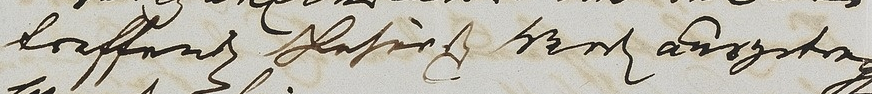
treffenden Behörde werden ausgetragen
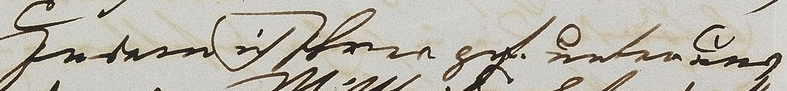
Indem ich Ihrer gef. unter uns
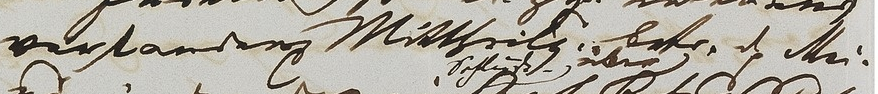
verstandenen Mittheilg. betr. die Mei -
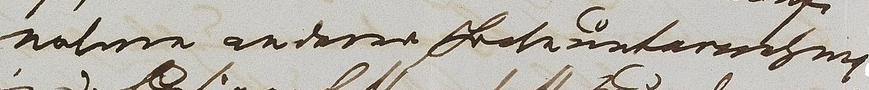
nahme anderer Bahnunternehmung
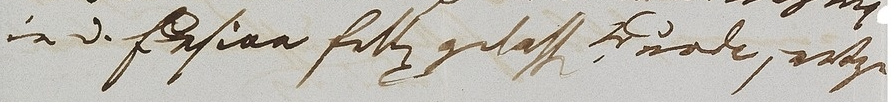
in d. Fusion fallen gelassen wurde, entgegen-
